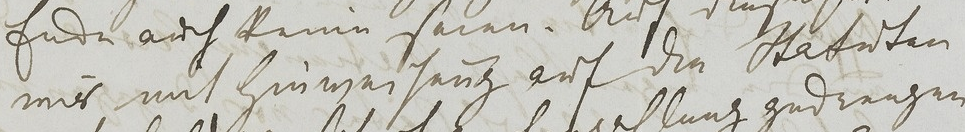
wir mit Hinweisung auf die Statuten
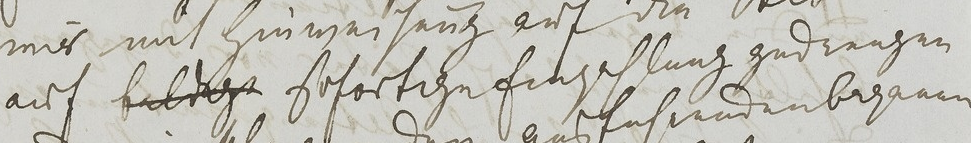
auf baldige sofortige Einzahlung gedrungen
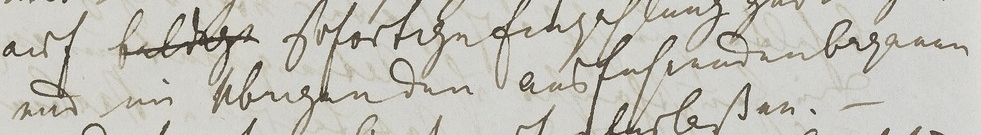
und im Übrigen den ausführenden Organen
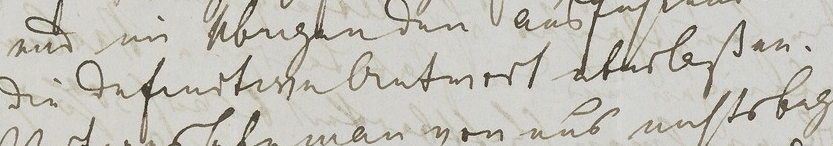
die definitive Antwort überlaßen. –
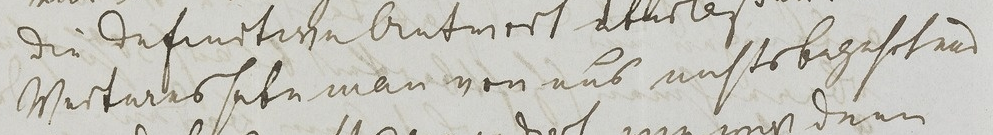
Weiteres habe man von uns nichts begehrt und
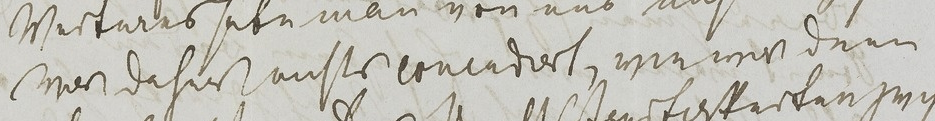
wir daher nichts concedirt, wie wir denn
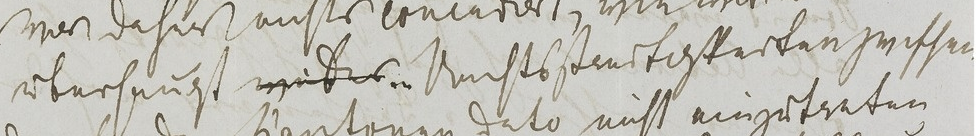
überhaupt wieder in Rechtsstreitigkeiten zwischen
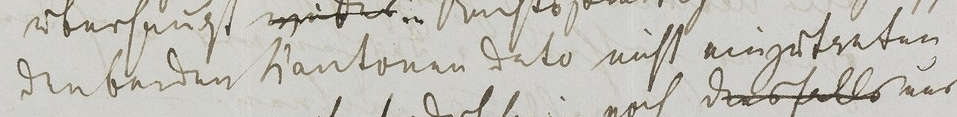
den beiden Kantonen dato nicht einzutreten
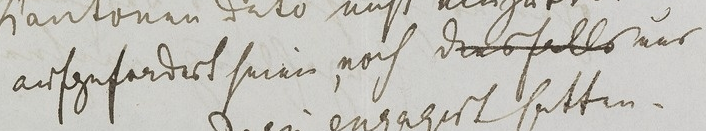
aufgefordert seien, noch diesfalls nur
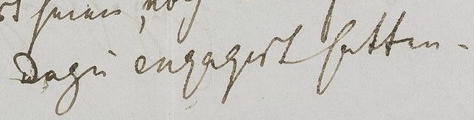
dazu engagirt hatten.
